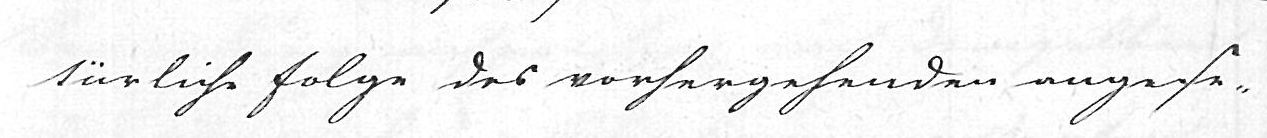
türliche Folge des vorhergehenden angese-
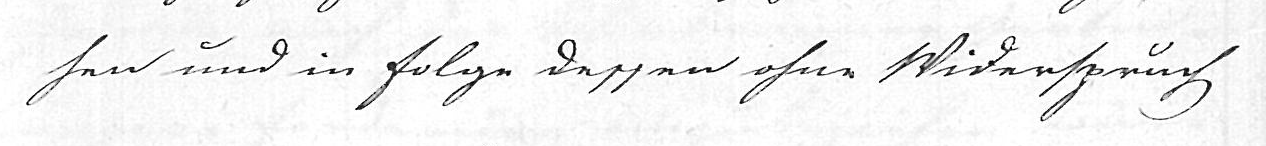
hen und in Folge dessen ohne Widerspruch
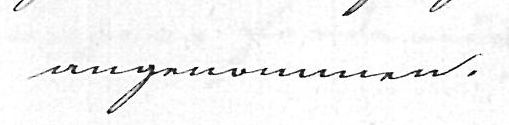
angenommen.
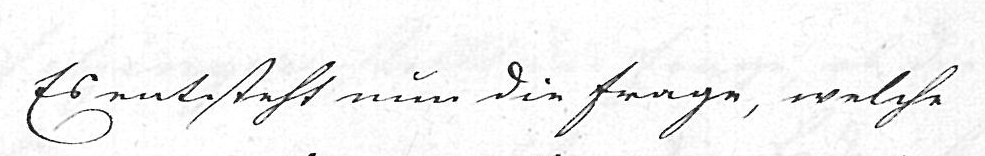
Es entsteht nun die Frage, welche
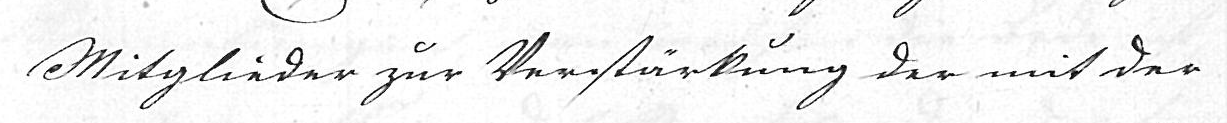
Mitglieder zur Verstärkung der mit der
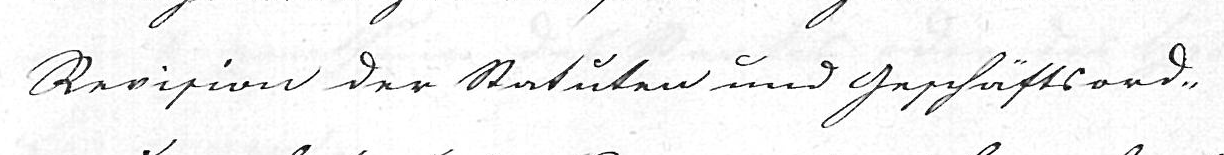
Revision der Statuten und Geschäftsord-
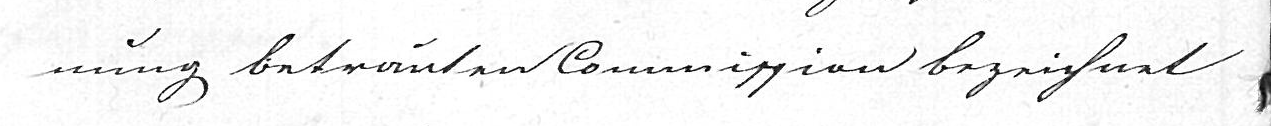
nung betrauten Commission bezeichnet
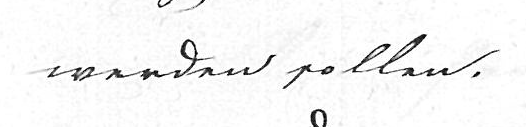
werden sollen.
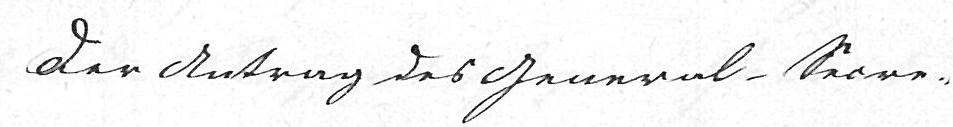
Der Antrag des General-Secre-
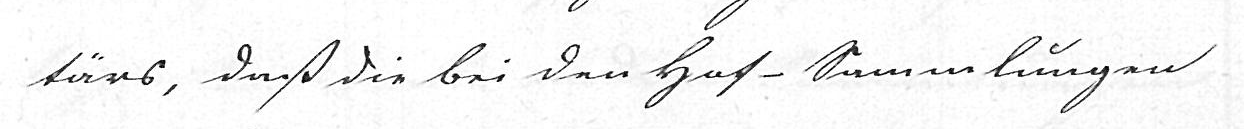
tär, daß die bei den Hof-Sammlungen
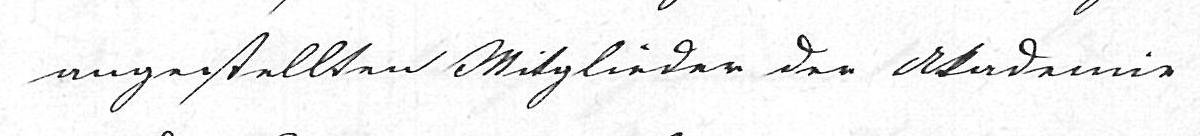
angestellten Mitglieder der Akademie
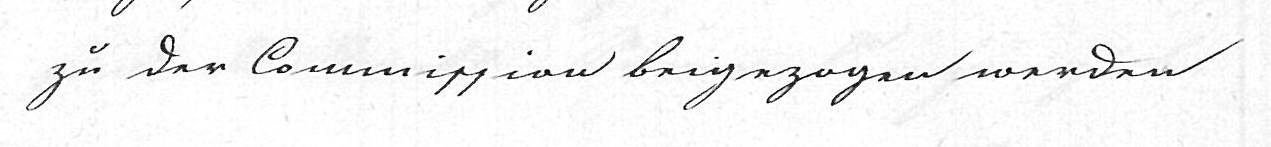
zu der Commission beigezogen werden
